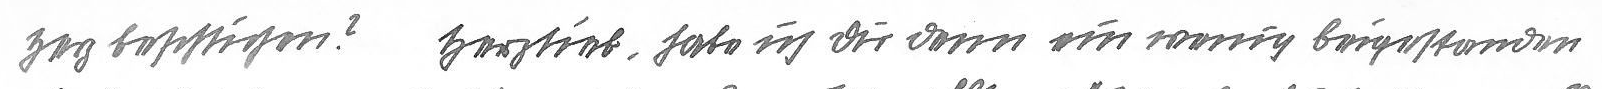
Herz beschlichen? Herzlieb, habe ich Dir denn ein wenig beigestanden
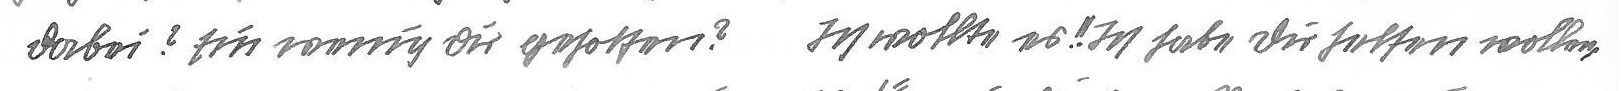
dabei? Ein wenig Dir geholfen? Ich wollte es!! Ich habe Dir helfen wollen,
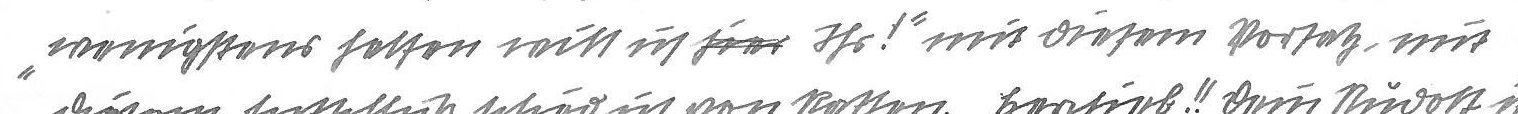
“wenigstens helfen will ich hier ihr!” mit diesem Vorsatz, mit
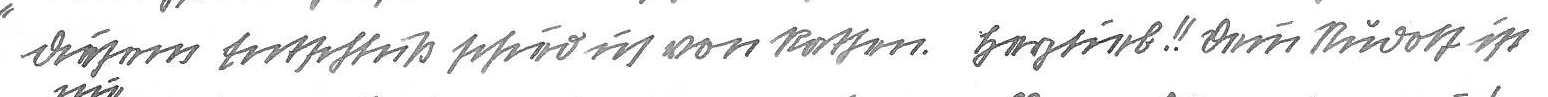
diesem Entschluß schied ich von R. Herzlieb!! Dein ist
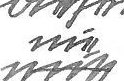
nie
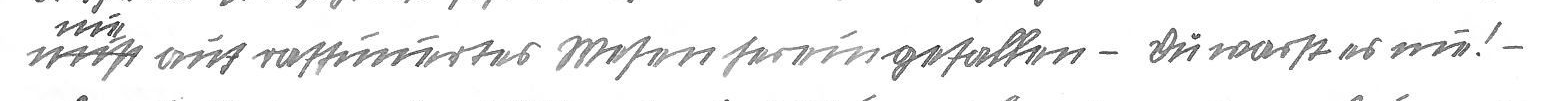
nicht auf raffiniertes Wesen hereingefallen – Du warst es nie! –
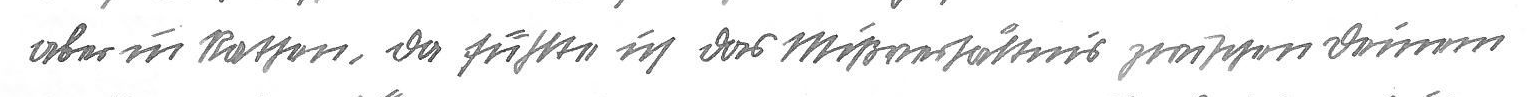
aber in R. da fühlte ich das Mißverständnis zwischen Deinem
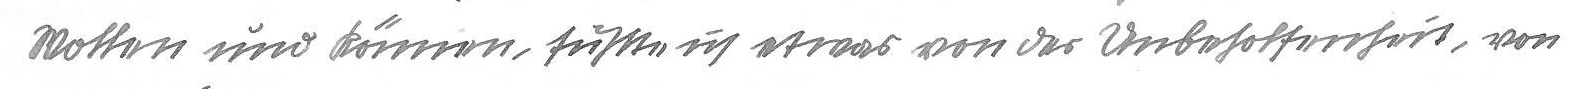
Wollen und Können, fühlte ich etwas von der Unbeholfenheit, von
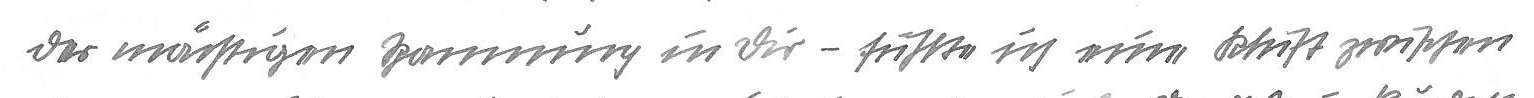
der mächtigen Spannung in Dir – fühlte ich eine Kluft zwischen
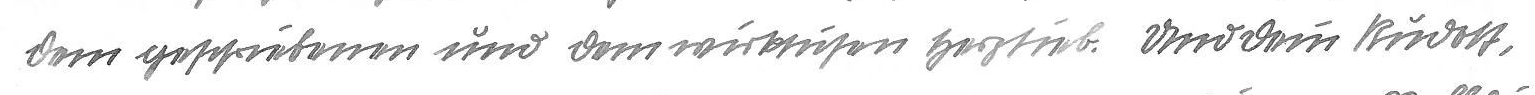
dem geschriebenem und dem wirklichen Herzlieb. und Dein ,
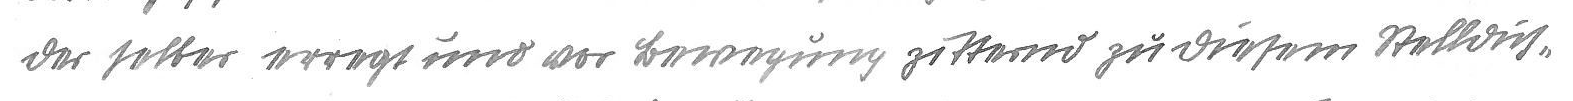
der selber erregt und vor Bewegung zitternd zu diesem Stelldich¬
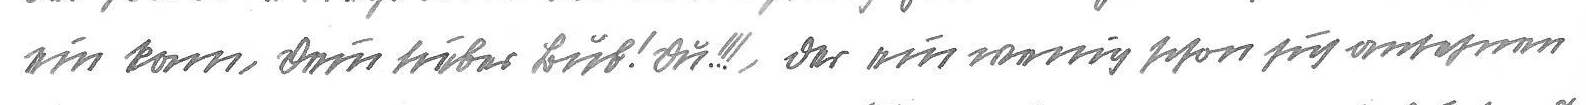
ein kam, Dein lieber Bub! Du!!!, der ein wenig schon sich anlehnen
